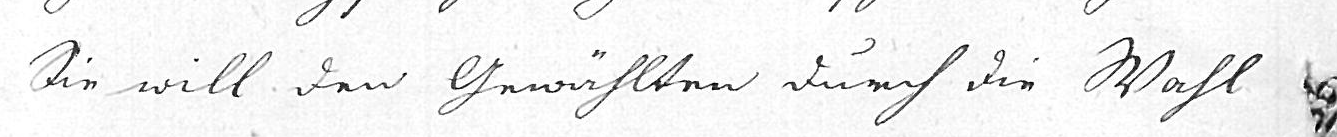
Sie will den Gewählten durch die Wahl
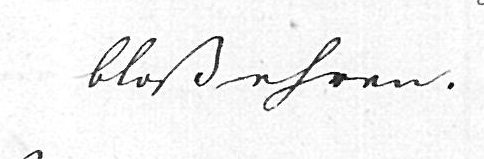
bloß ehren.
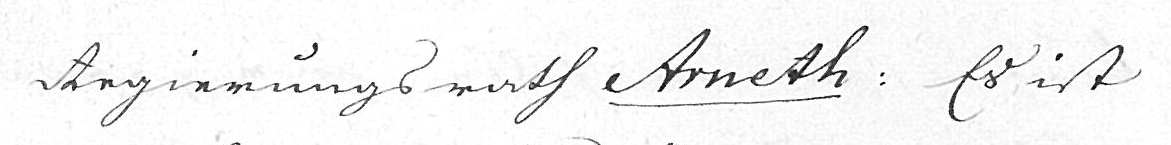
Regierungsrath Arneth: Es ist
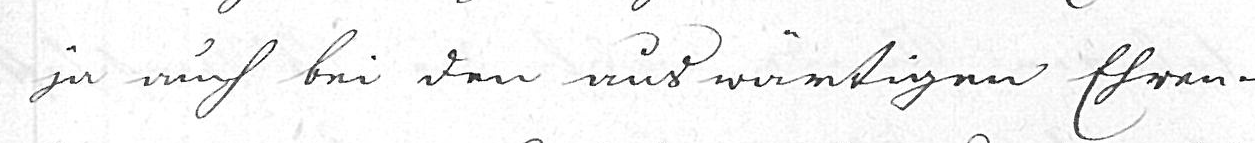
ja auch bei den auswärtigen Ehren-
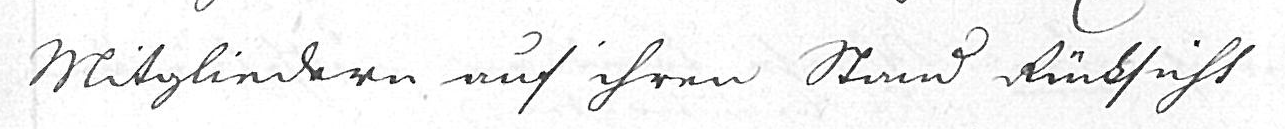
Mitgliedern auf ihren Stand Rücksicht
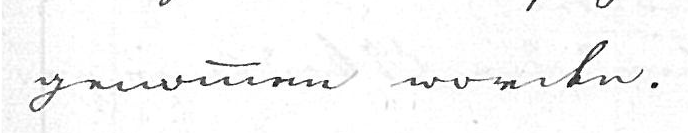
genommen worden.
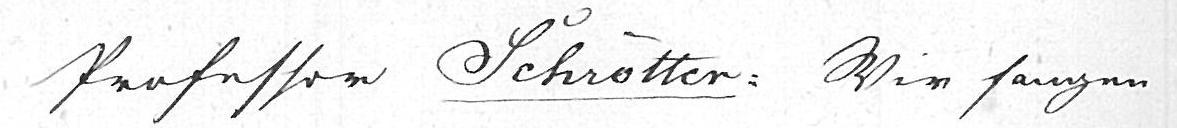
Professor Schrötter: Wir fangen
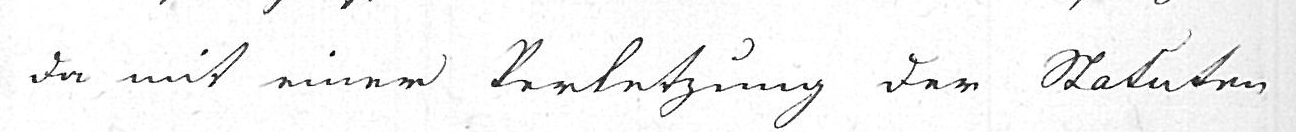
da mit eienr Verletzung der Statuten
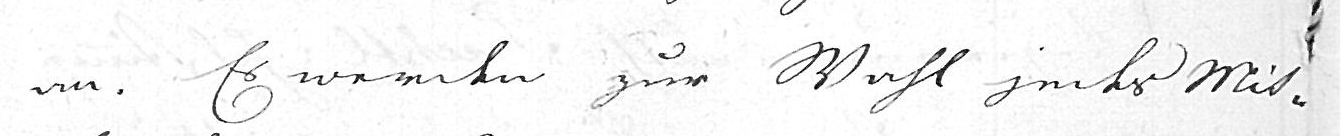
an. Es werden zur Wahl jedes Mit-
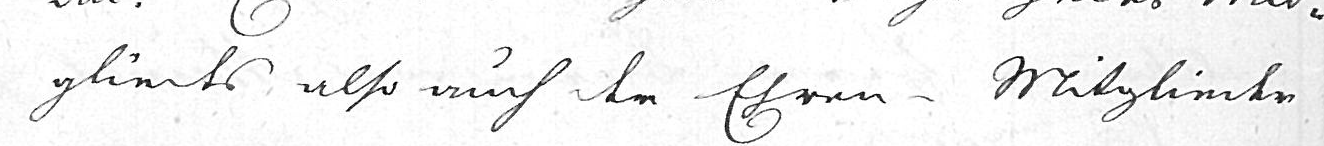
glieds also auch der Ehren-Mitglieder
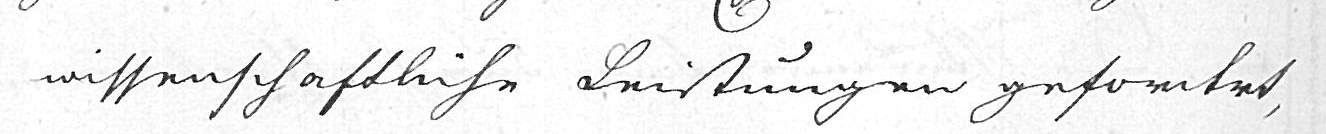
wissenschaftliche Leistungen gefordert,
